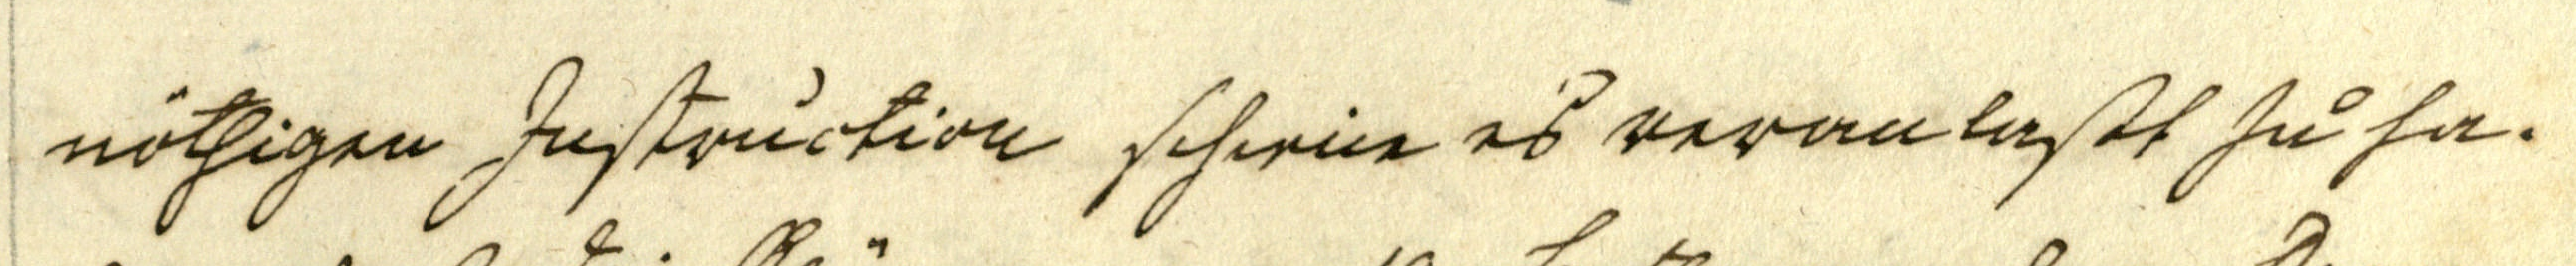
nöthigen Instruction scheine es veranlaßt zu ha
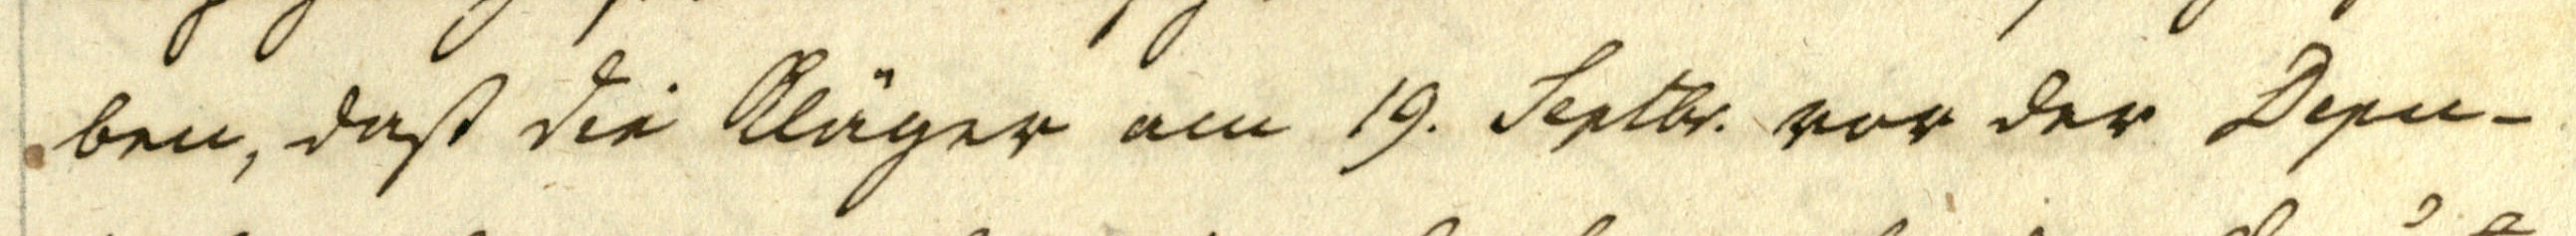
ben, daß die Kläger am 19. Septbr. vor der Depu¬
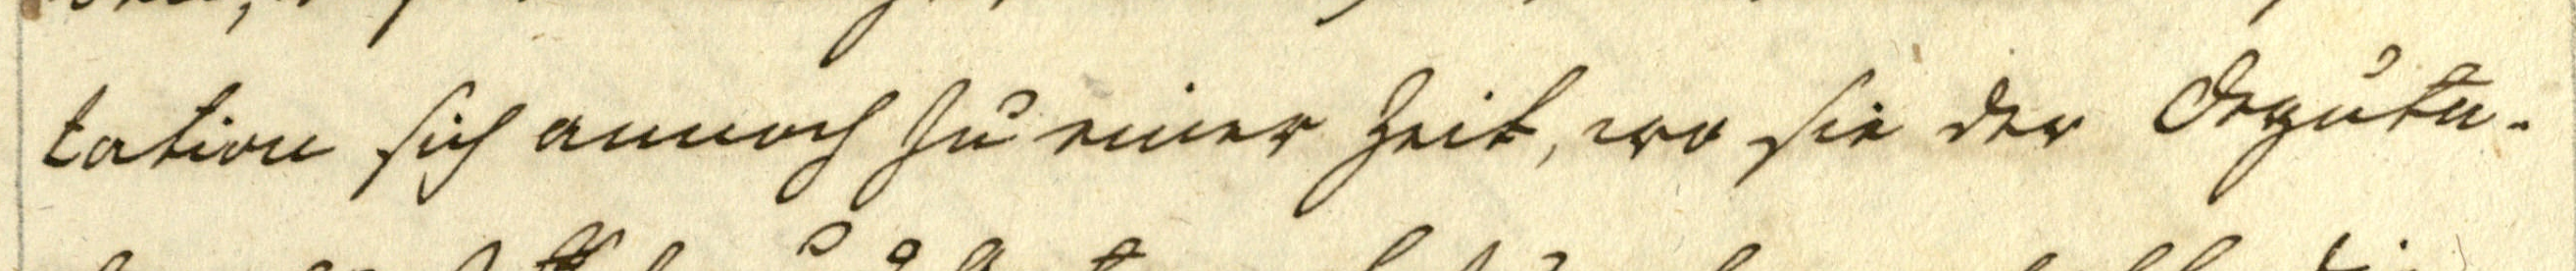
tation sich annoch zu einer Zeit, wo sie der Deputa¬
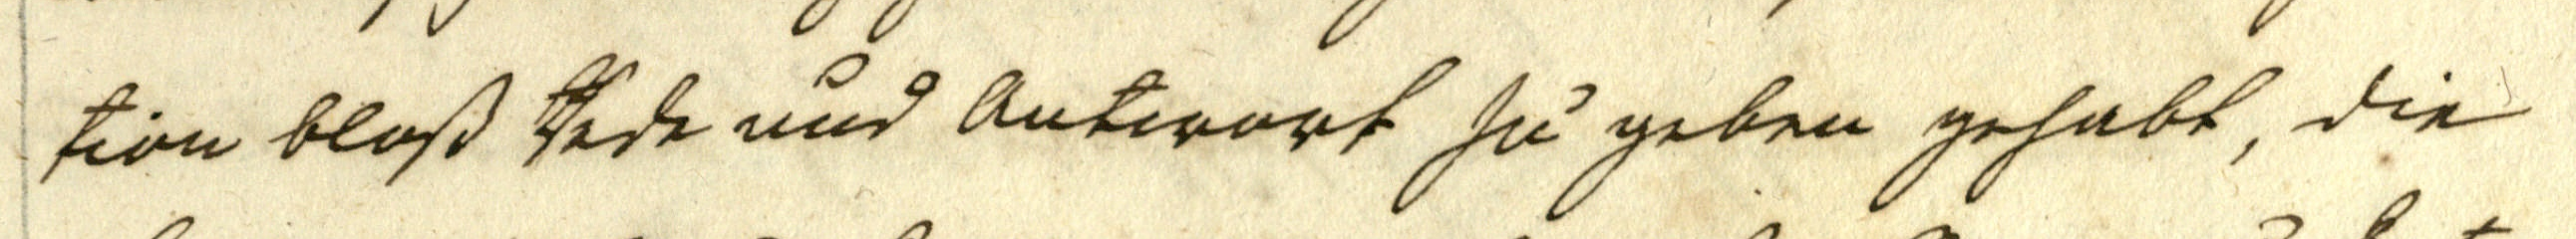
tion bloß Rede und Antwort zu geben gehabt, die
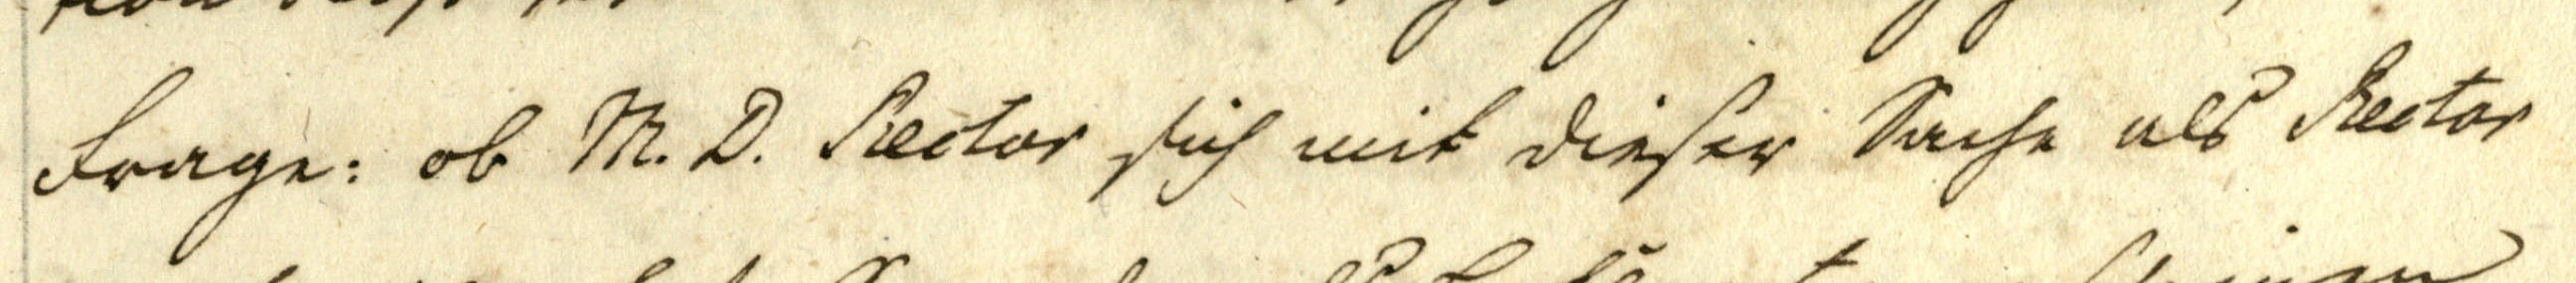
Frage: ob M. D. Rector sich mit dieser Sache als Rector
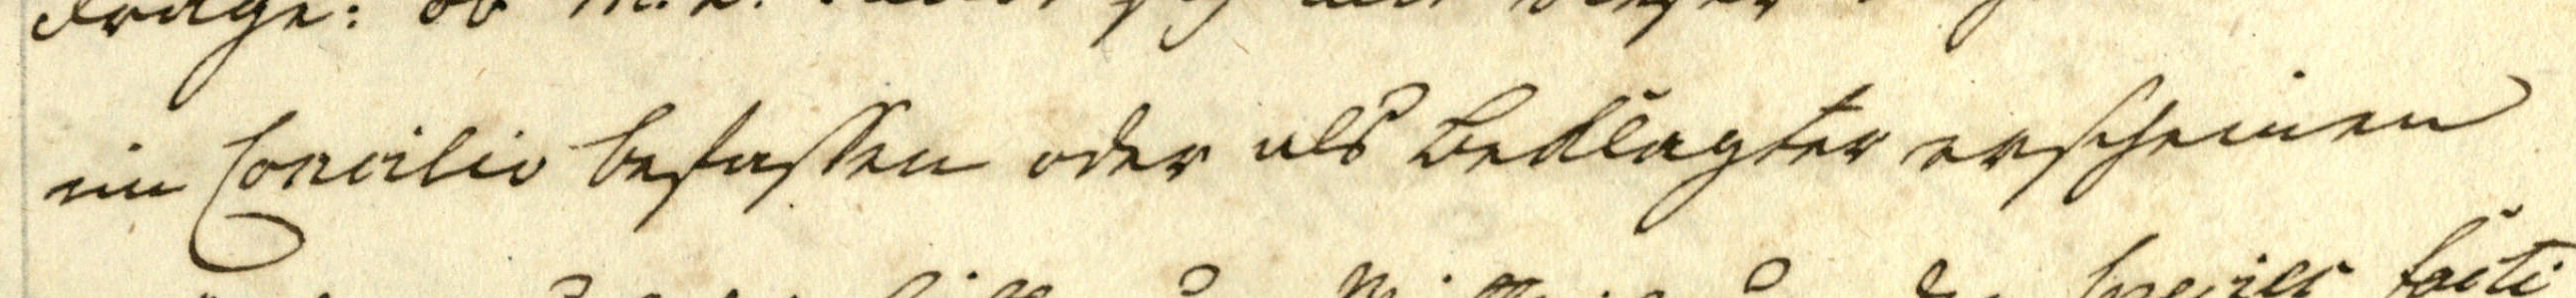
im Concilio befassen oder als Beklagter erscheinen
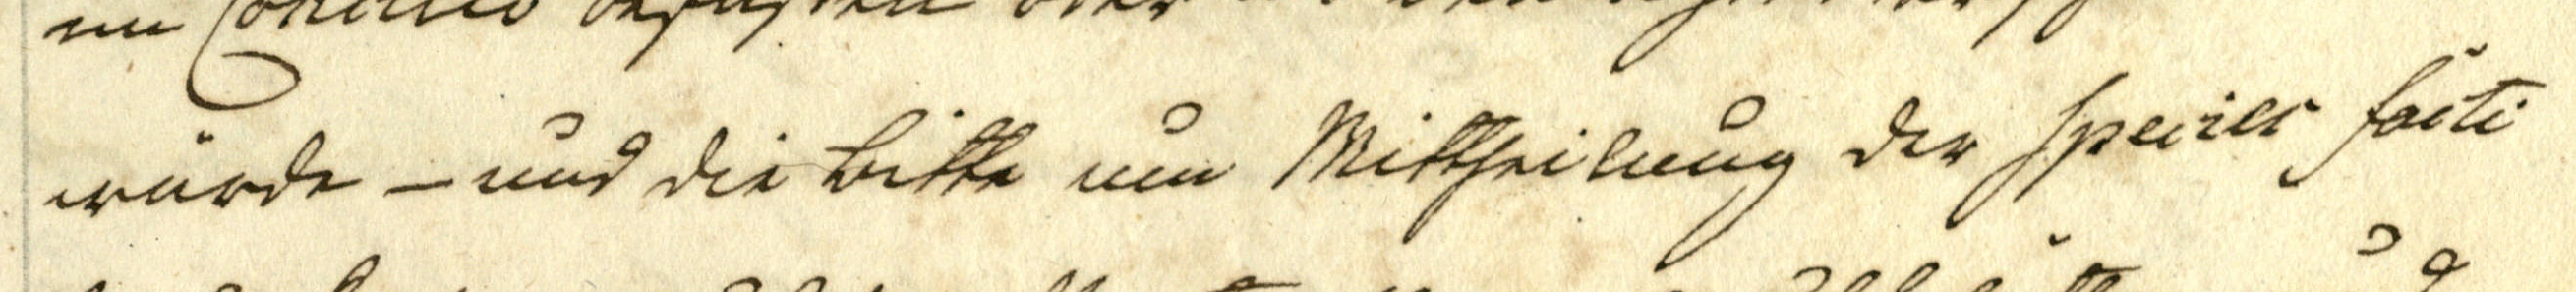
würde - und die Bitte um Mittheilung der Species Facti
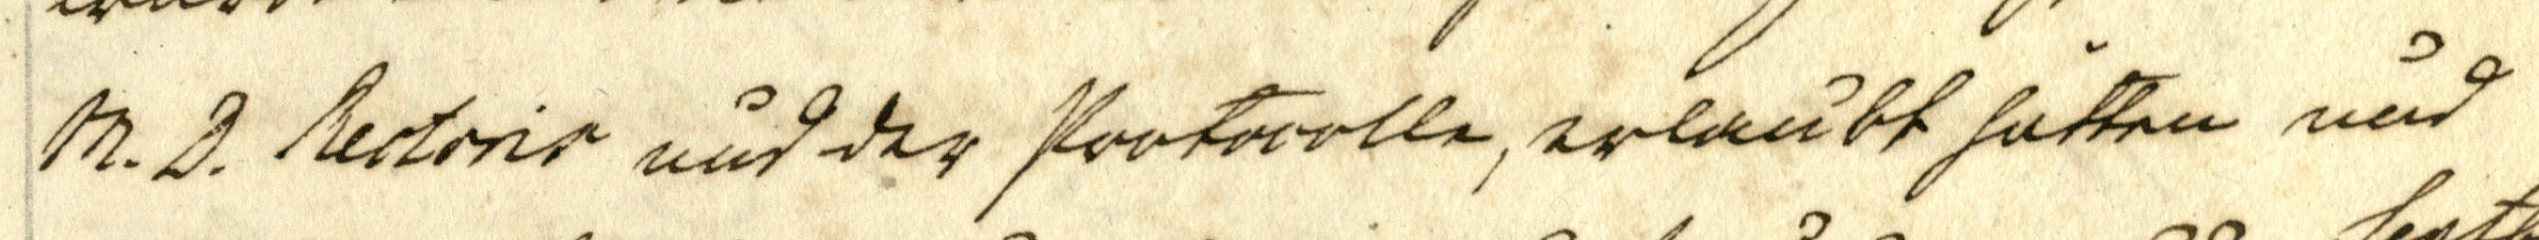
M. D. Rectoris und der Protocolle, erlaubt hätten und
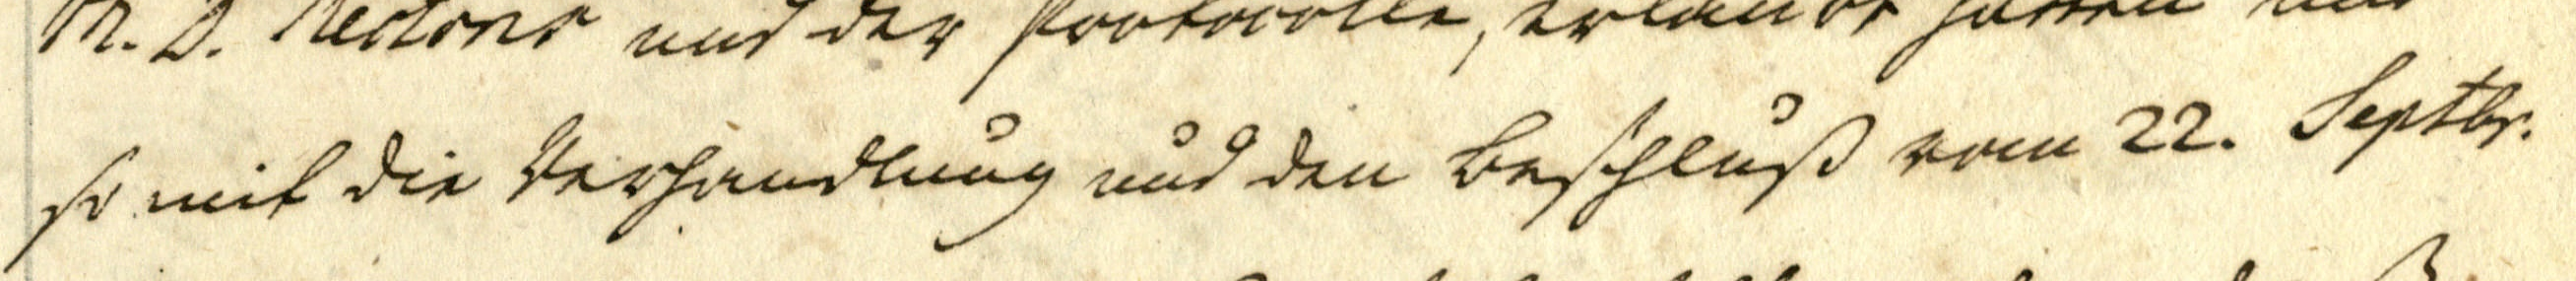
so mit die Verhandlung und den Beschluß vom 22. Septbr.
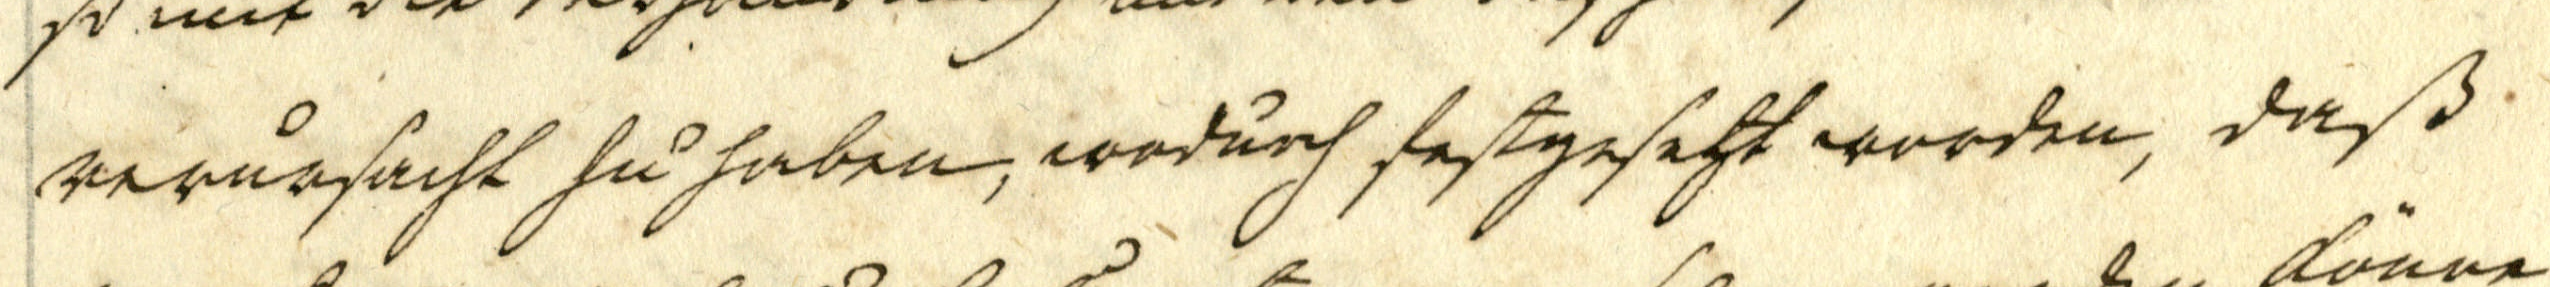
verursacht zu haben, wodurch festgesetzt worden, daß
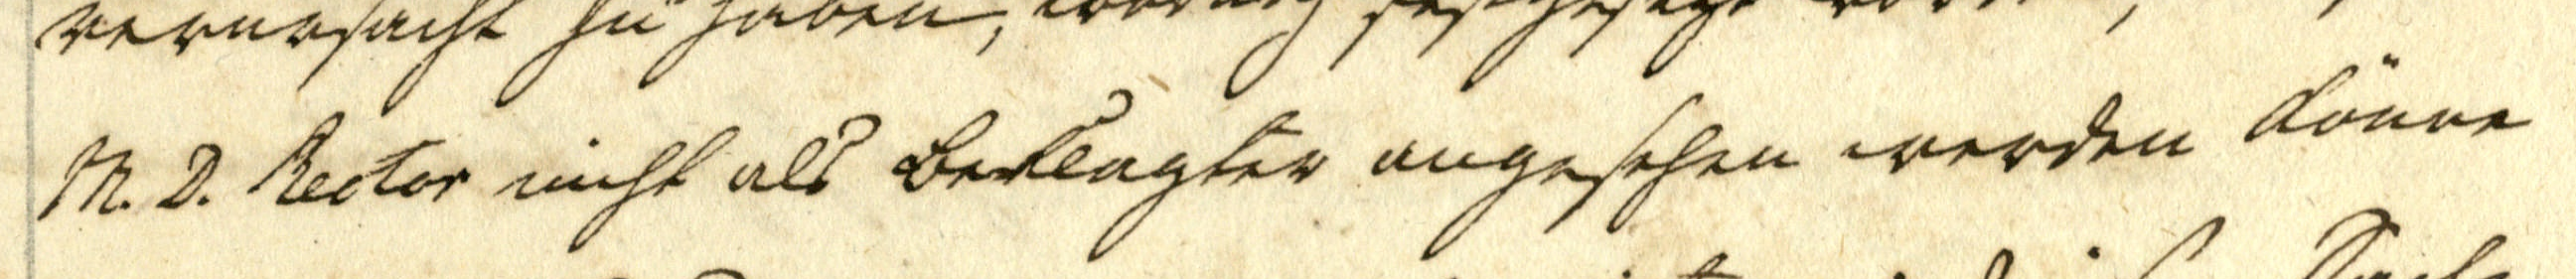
M. D. Rector nicht als Beklagter angesehen werden könne
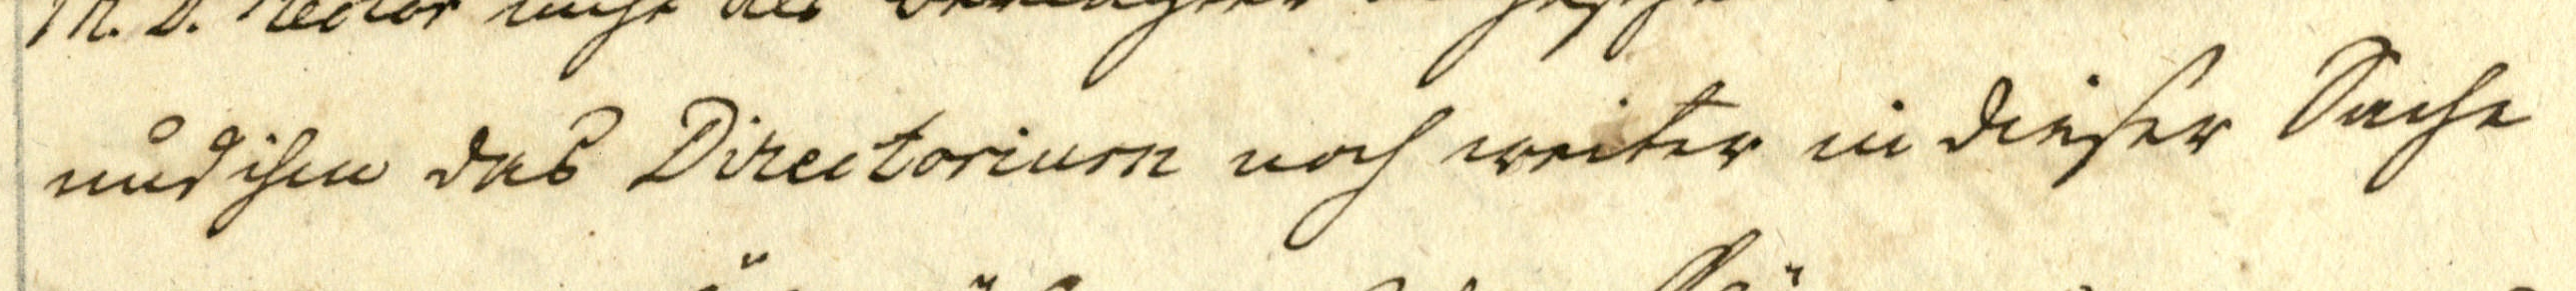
und ihm das Directorium noch weiter in dieser Sache
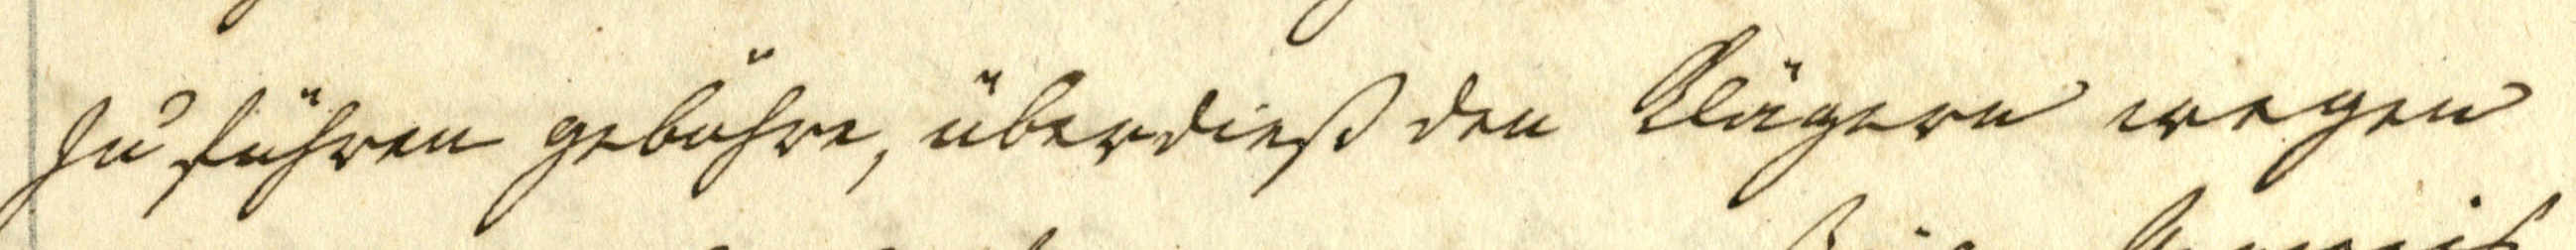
zu führen gebühre, überdieß den Klägern wegen
